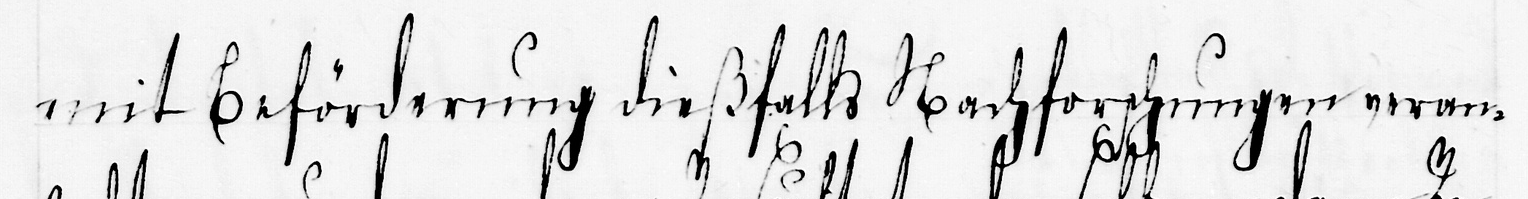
mit Beförderung dießfalls Nachforschungen veran¬
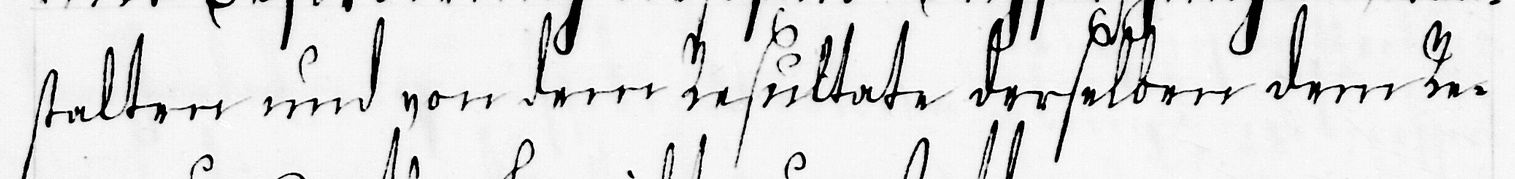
stalten und von dem Resultate derselben dem Re¬
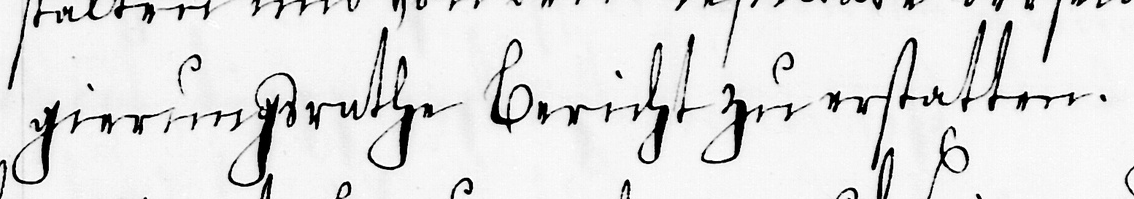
gierungsrathe Bericht zu erstatten.
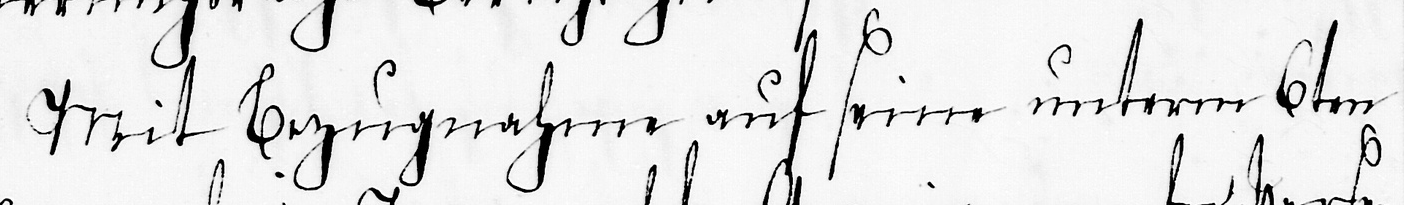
Mit Bezugnahme auf seine unterm 6ten
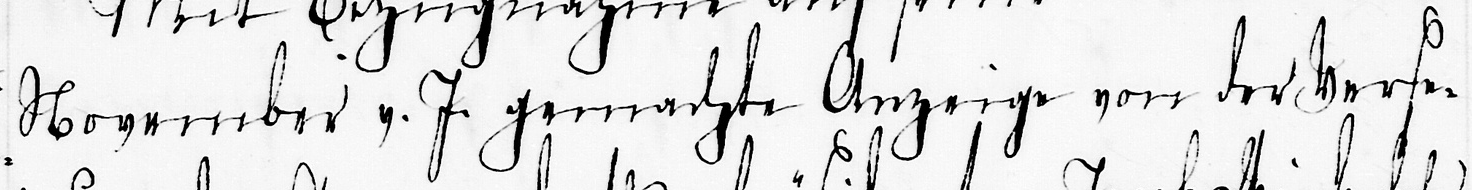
November v. J. gemachte Anzeige von der Verse¬
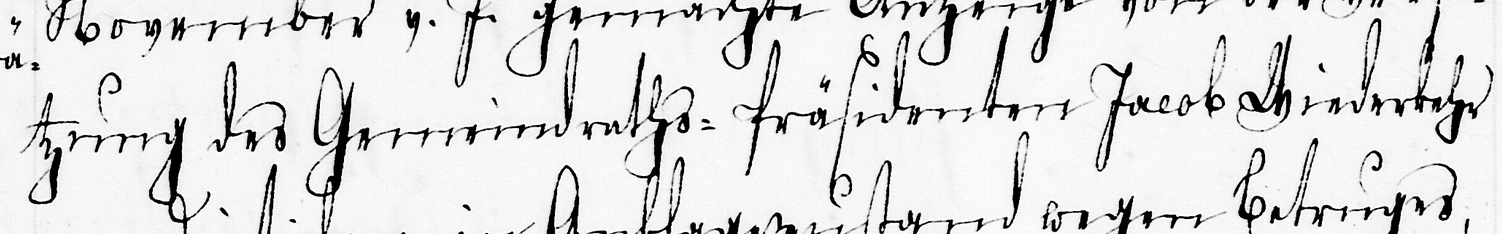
tzung des Gemeindraths-Präsidenten Jacob Wiederkehr
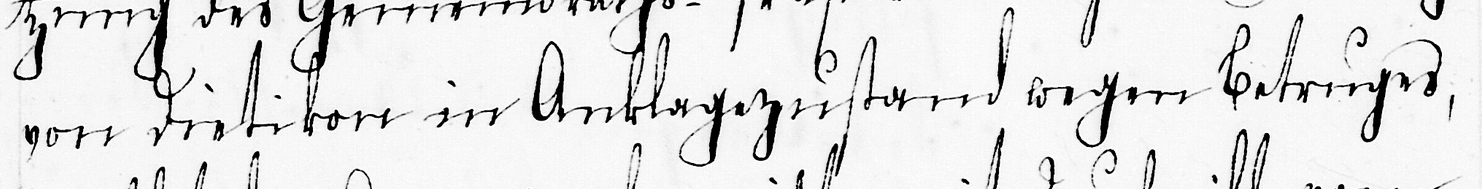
von Dietikon in Anklagezustand wegen Betruges,
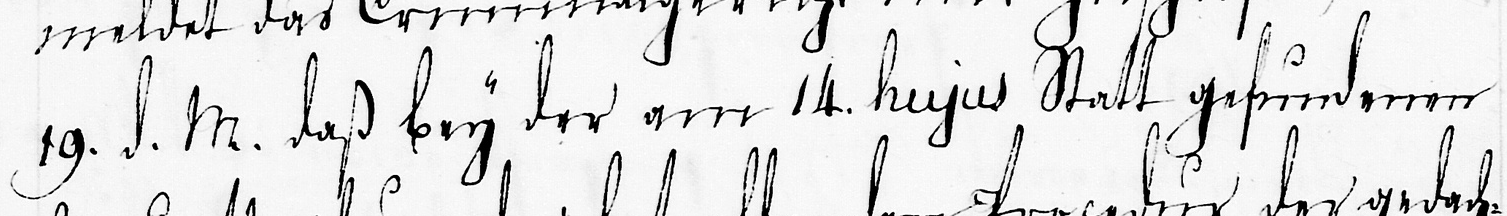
19. d. M. daß bey der am 14. hujus Statt gefundenen
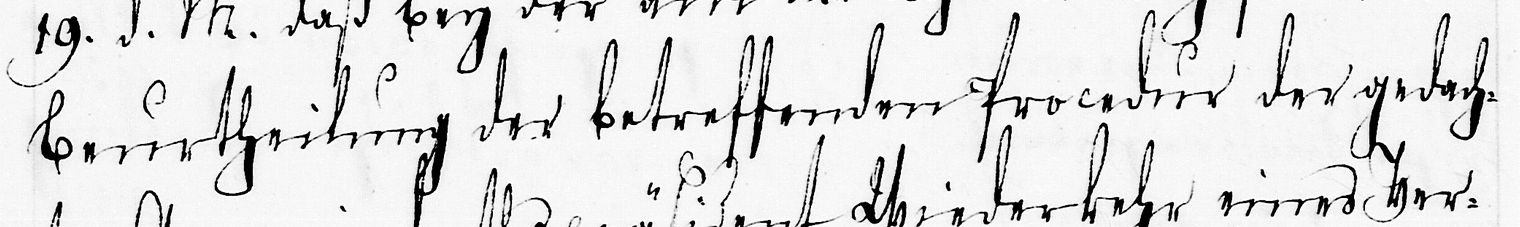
Beurtheilung der betreffenden Procedur der gedach¬
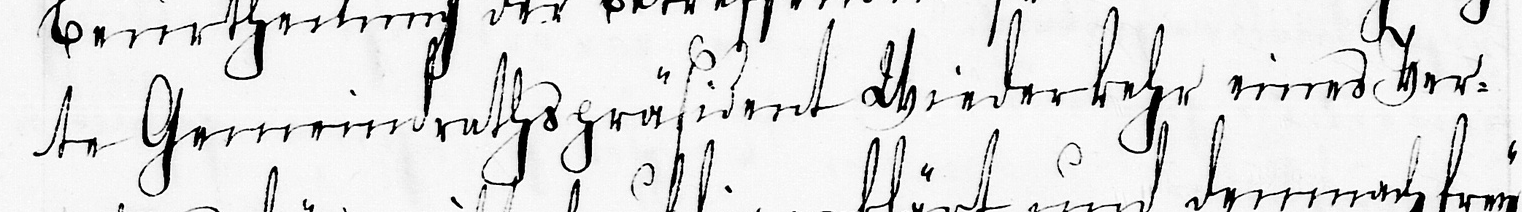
te Gemeindrathspräsident Wiederkehr eines Ver¬
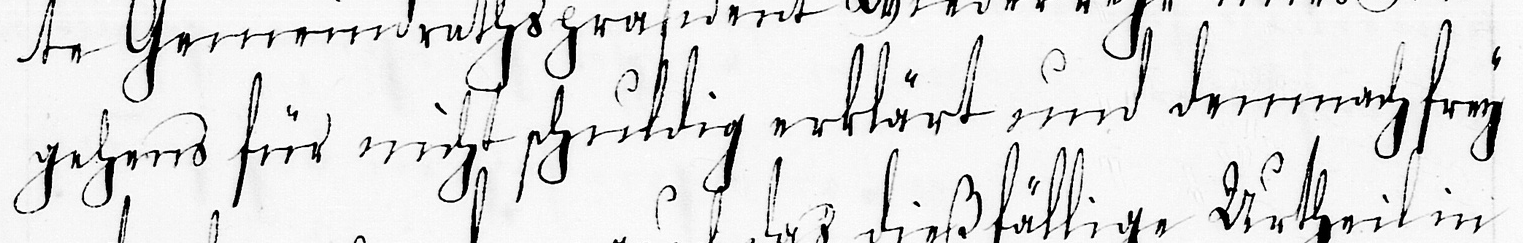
gehens für nicht schuldig erklärt und demnach frey
